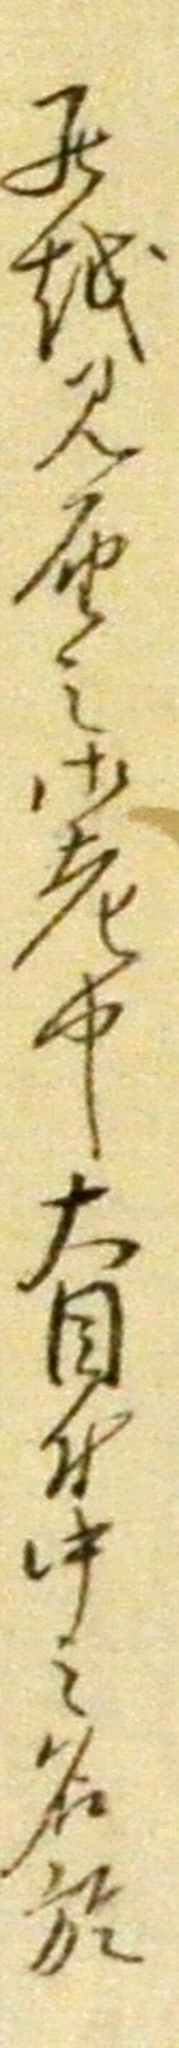罷越見届之御老中大目付中之名於
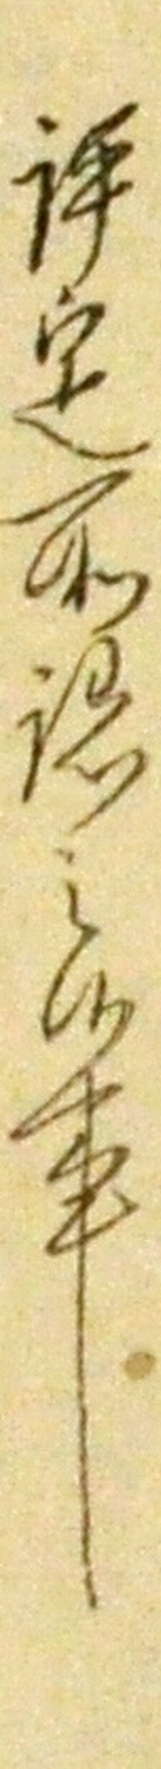評定所認之候事
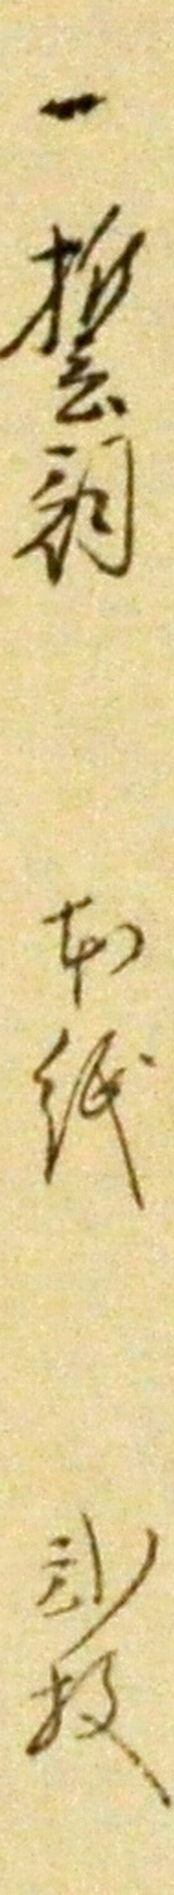一誓詞本紙弐枚
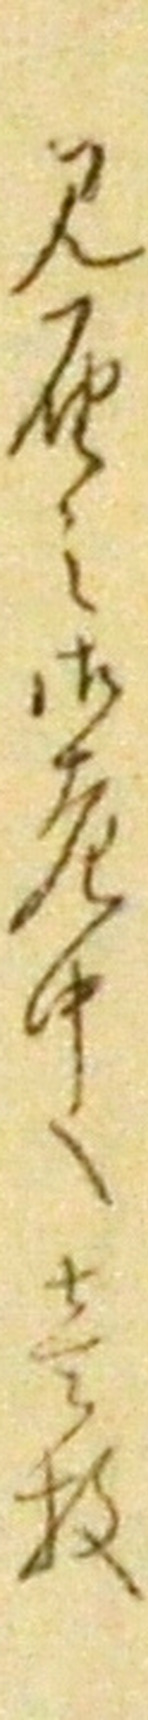見届之御老中へ壱枚
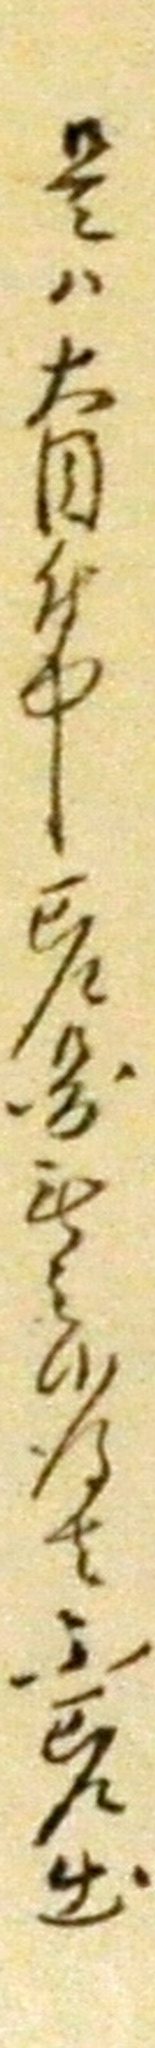是は大目付中差図無之候得は不差出
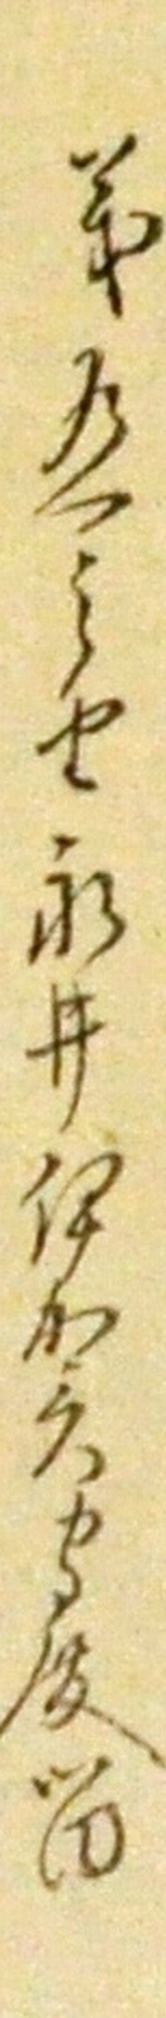義有之由永井伊賀守殿留
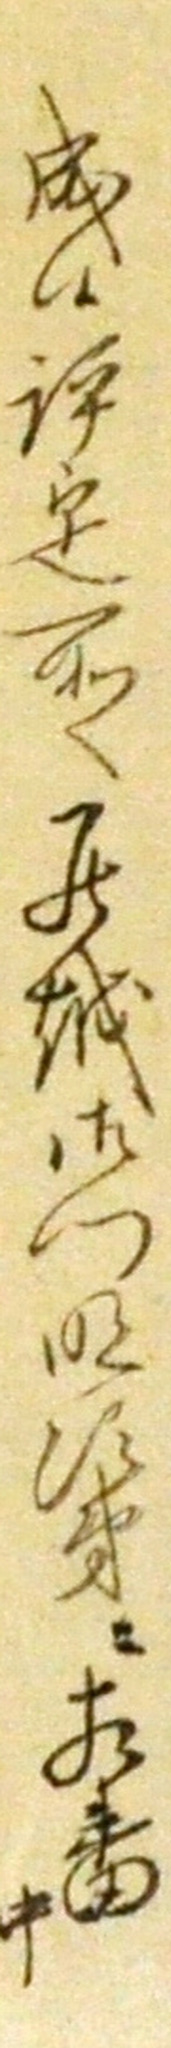成候評定所へ罷越御門明次第に相番中
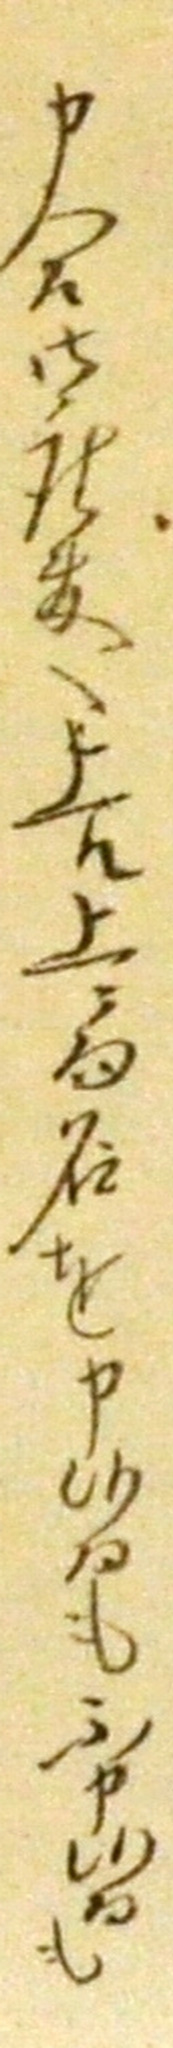申合御座敷へ上ル上に而名を申候而も不申候而も
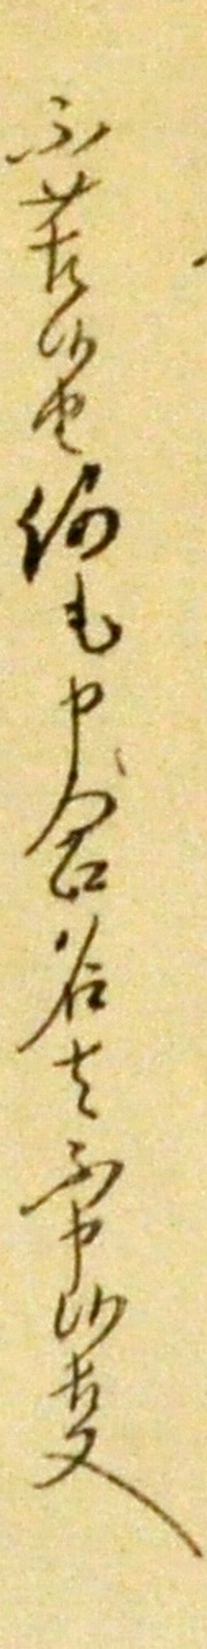不苦候由何も申合名は不申候事
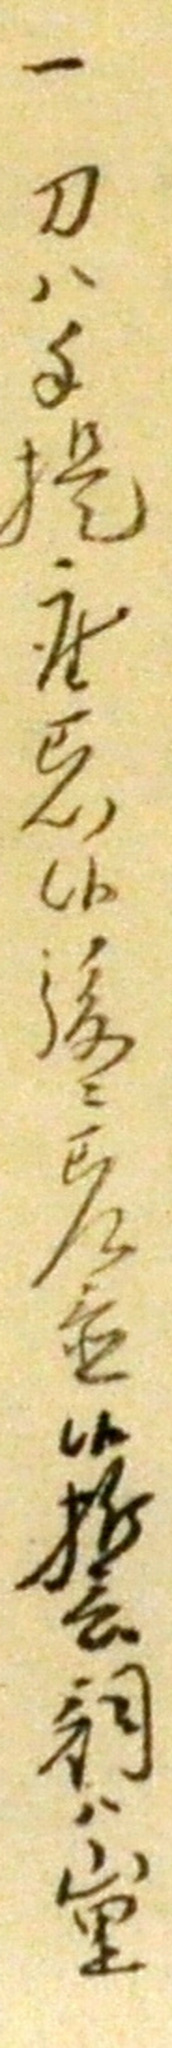一刀は手提座着候後に差置候誓詞は山里
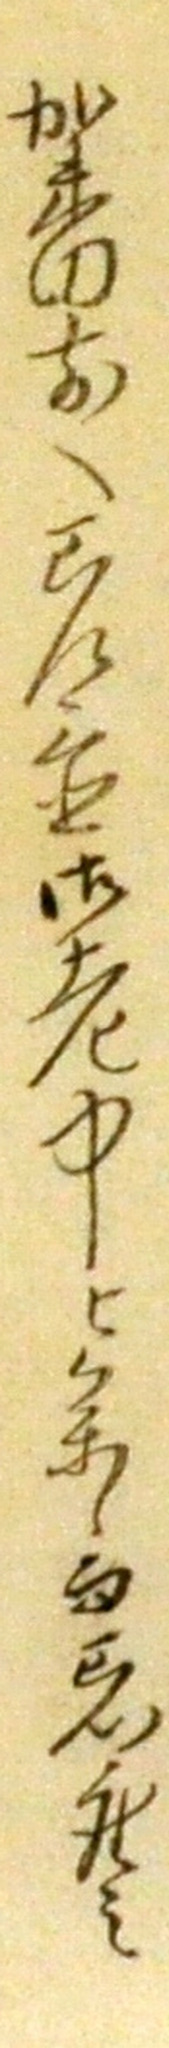加番前へ差置御老中被参候而着座之
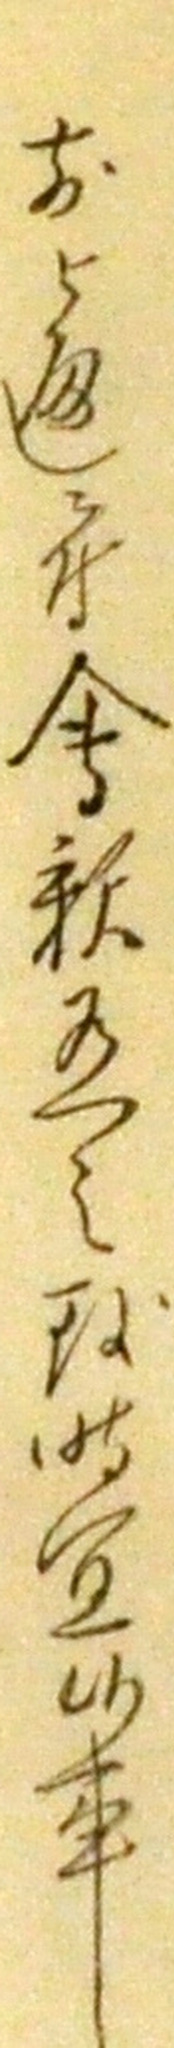前被通に付会釈有之致時宜候事
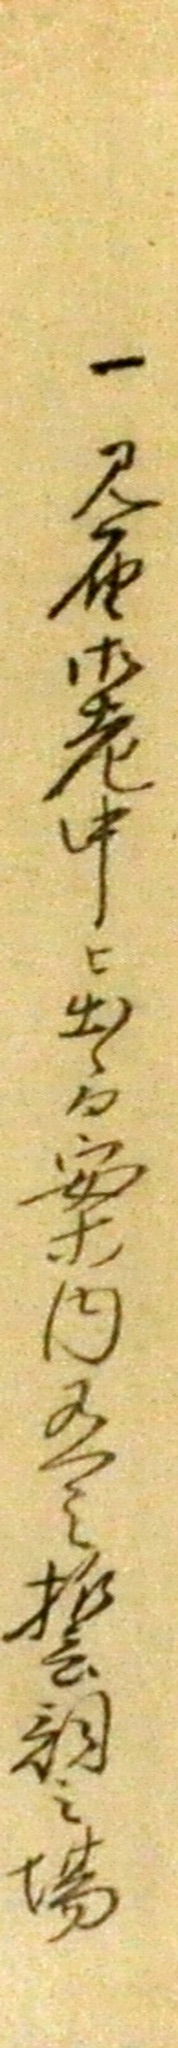一見届御老中被出候而案内有之誓詞之場
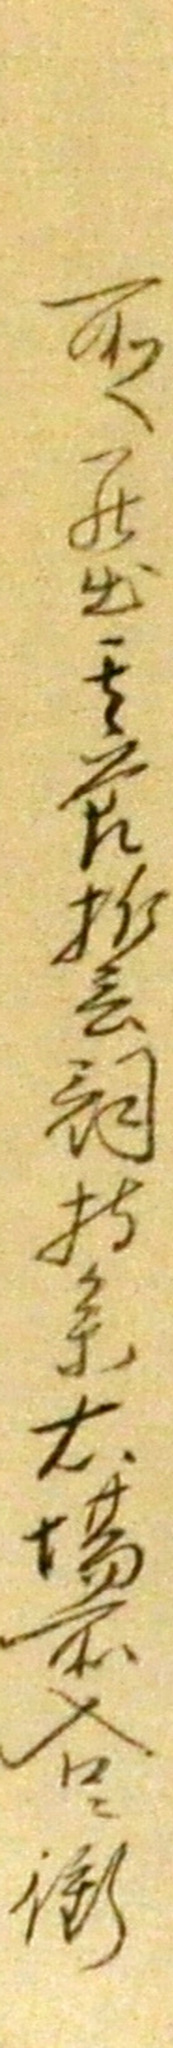所へ罷出其節誓詞持参右場所入口に衝
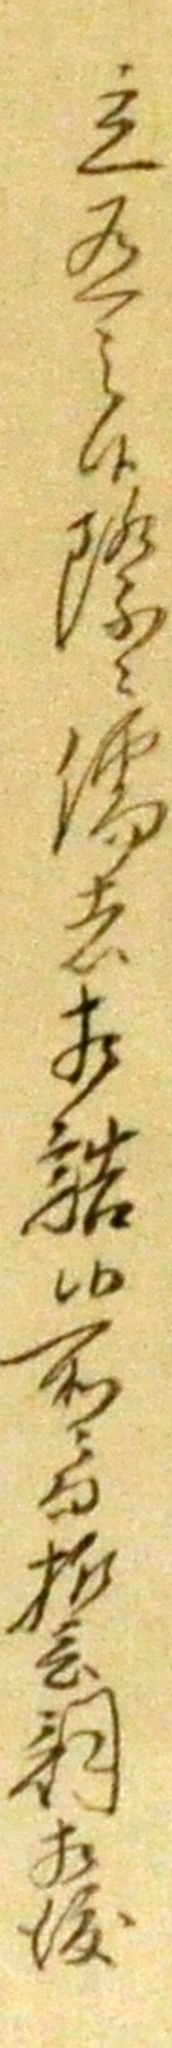立有之候際に儒者相詰候所に而誓詞相渡
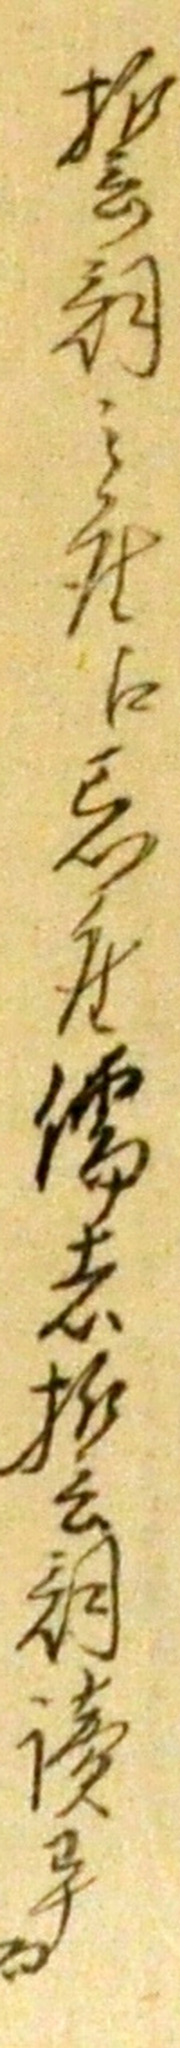誓詞之座え着座儒者誓詞読畢而
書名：大阪加番関係諸書留〔一括〕
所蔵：伊那市立高遠町図書館・合同会社AMANE
